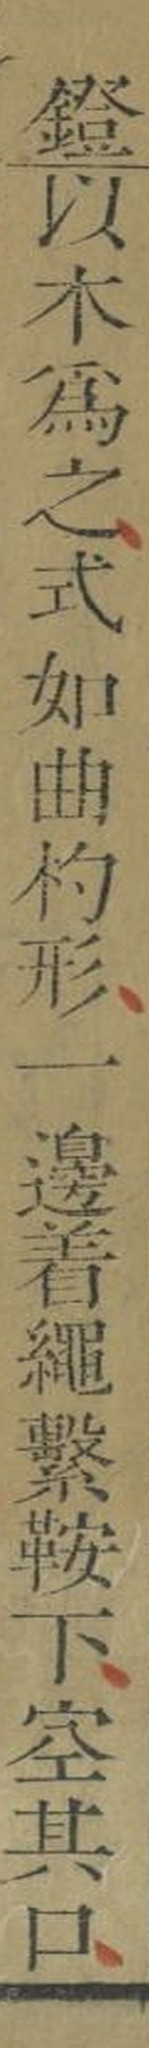[鐙]以木為之式如曲杓形一辺着縄繋鞍下空其口
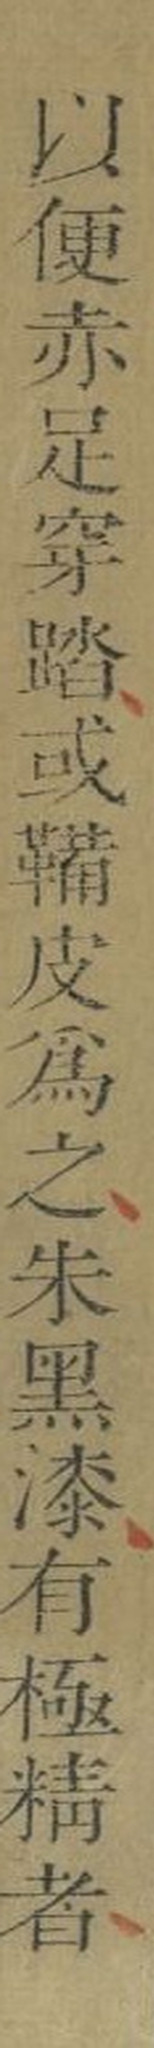以便赤足穿踏或鞴皮為之朱黒漆有極精者
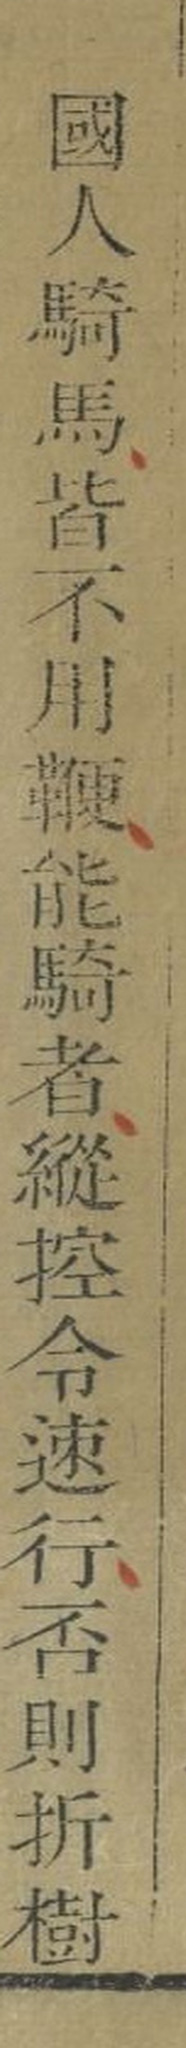国人騎馬皆不用鞭能騎者縦控令速行否則折樹
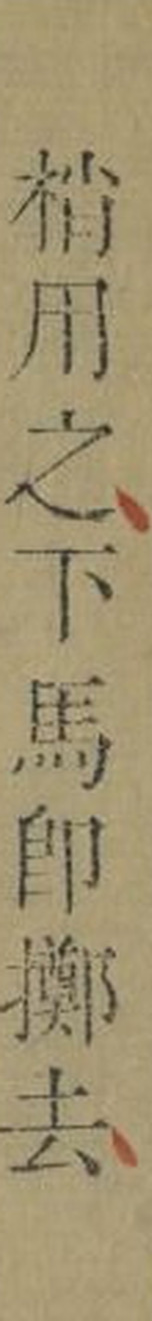梢用之下馬即擲去
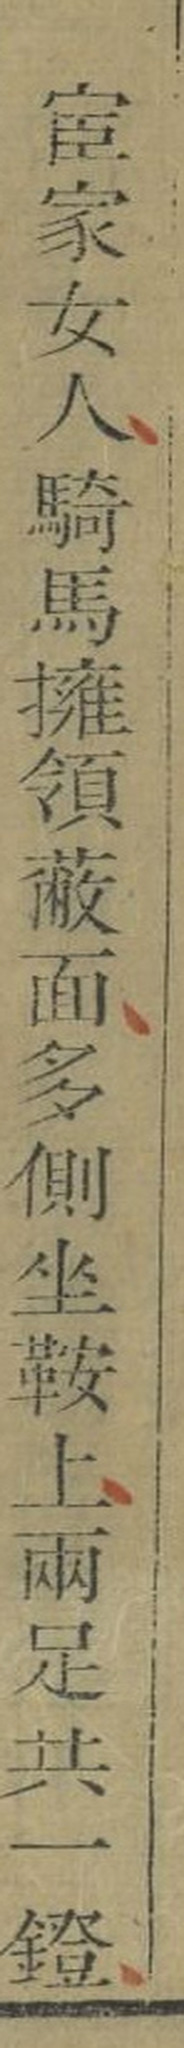宦家女人騎馬擁領蔽面多側坐鞍上両足共一鐙
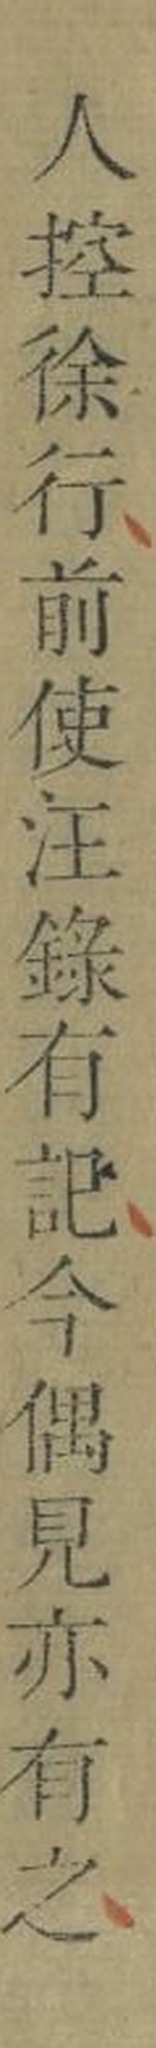人控徐行前使汪録有記今偶見亦有之
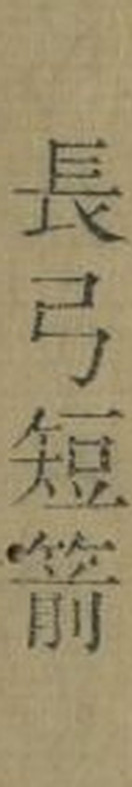長弓短箭

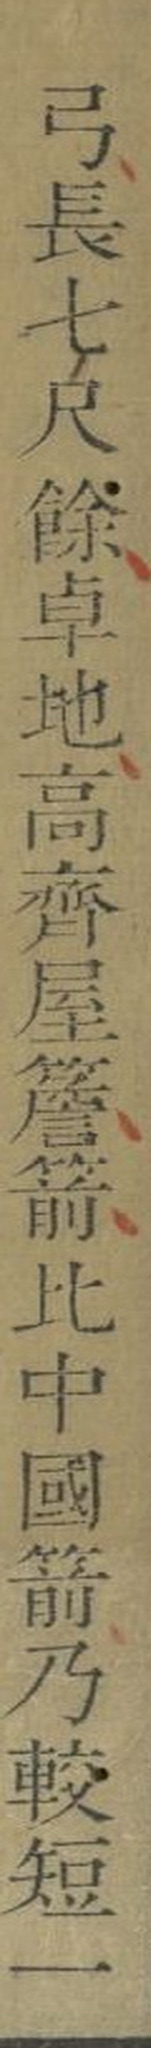弓長七尺余卓地高斉屋簷箭比中国箭乃較短一
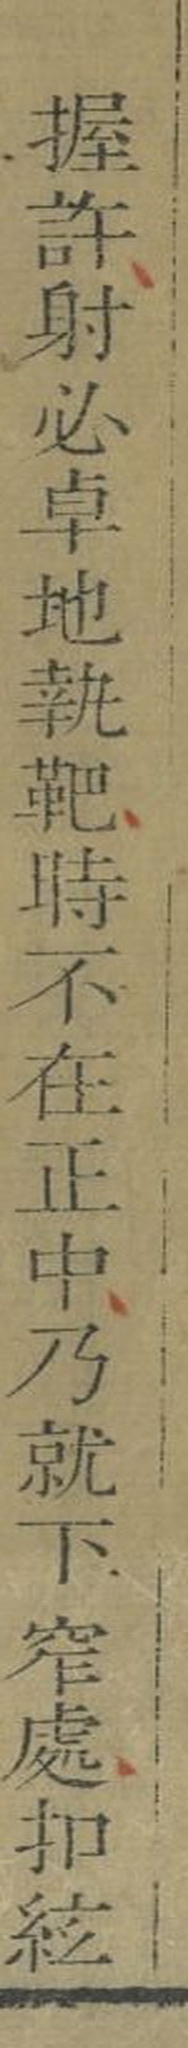握許射必卓地執靶時不在正中乃就下窄処扣絃
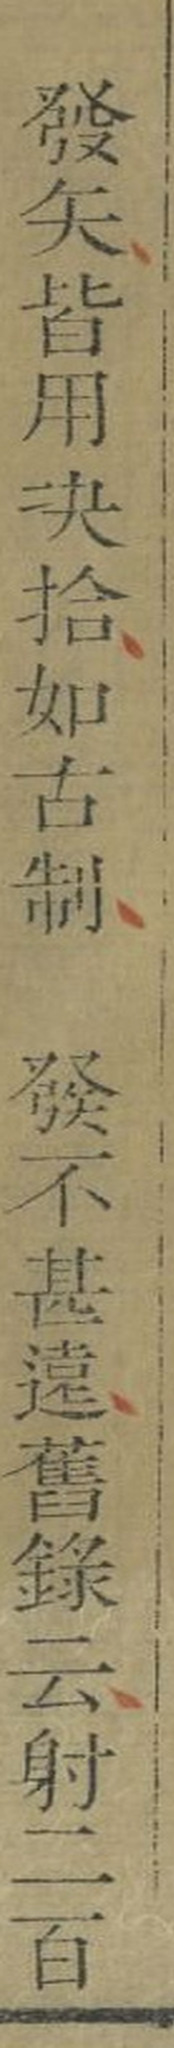発矢皆用決拾如古制発不甚遠旧録云射二百
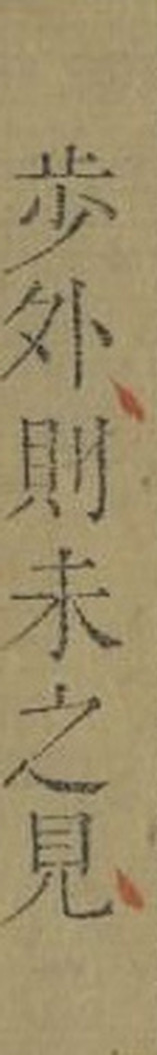歩外則未之見
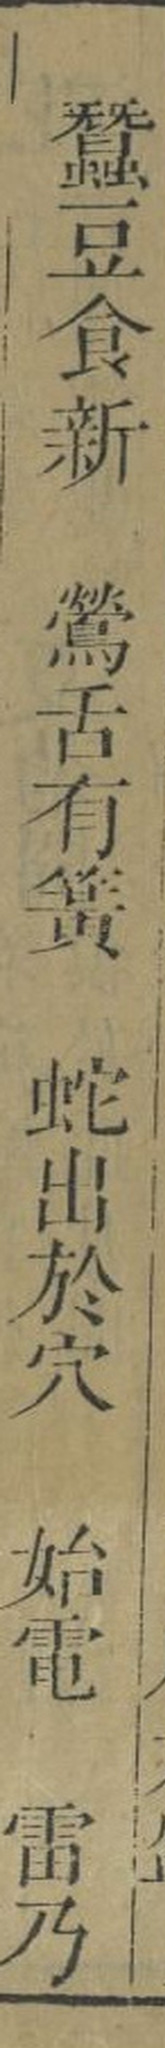蠶豆食新鶯舌有簧蛇出於穴始電雷乃
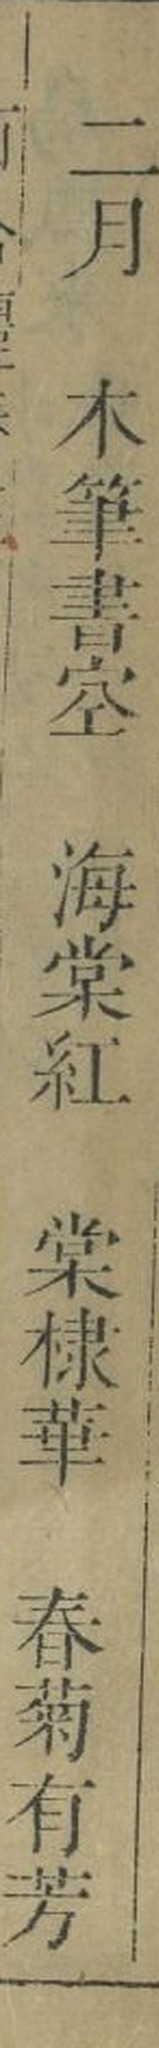二月木筆書空海棠紅棠棣華春菊有芳
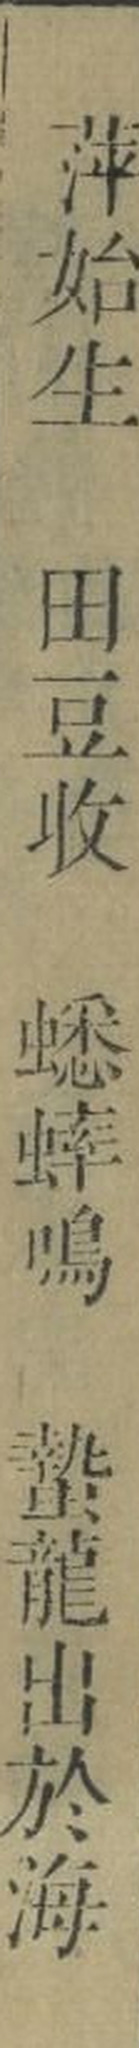萍始生田豆收蟋蟀鳴蟄竜出於海
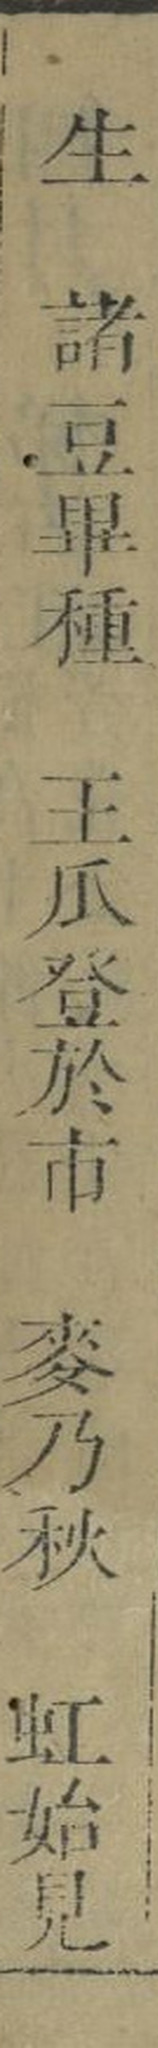生諸豆畢種王瓜登於市麦乃秋虹始見

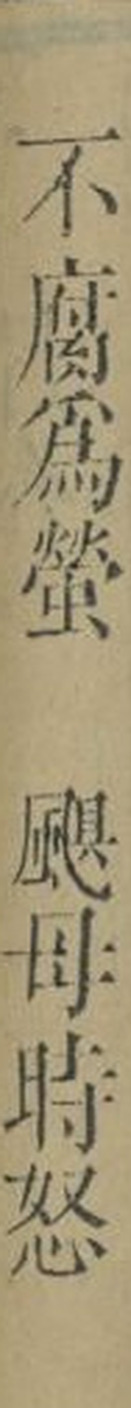不腐為蛍颶母時怒
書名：中山伝信録 巻六
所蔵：University of the Ryukyus Library
